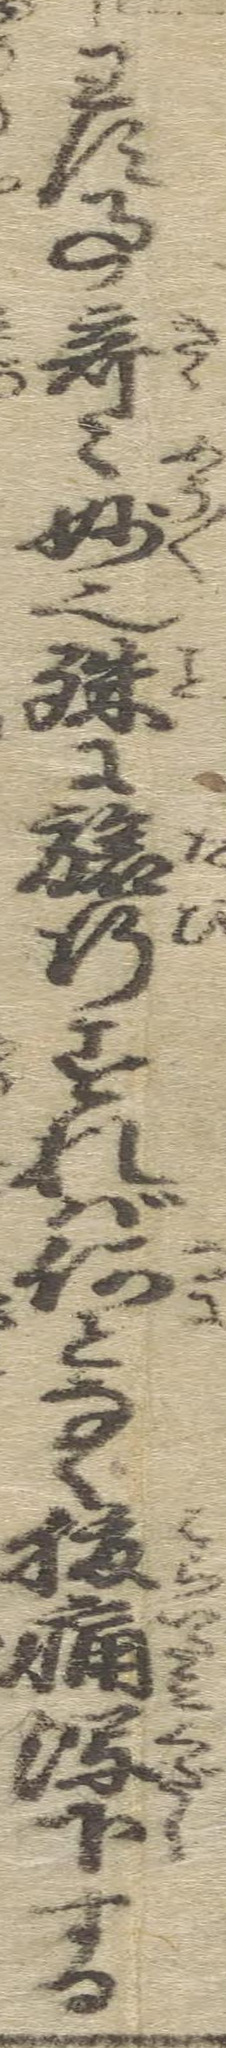わす事奇々妙也殊に旅行すれば何となく腹痛瀉下する
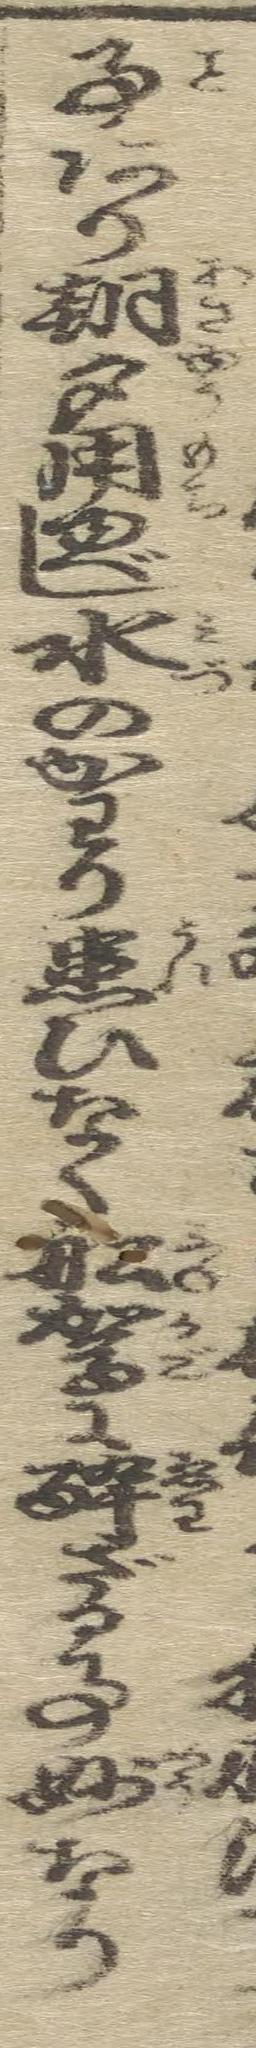事あり朝夕用ゆべし水のかわり患ひなく船駕に酔ざる事妙なり
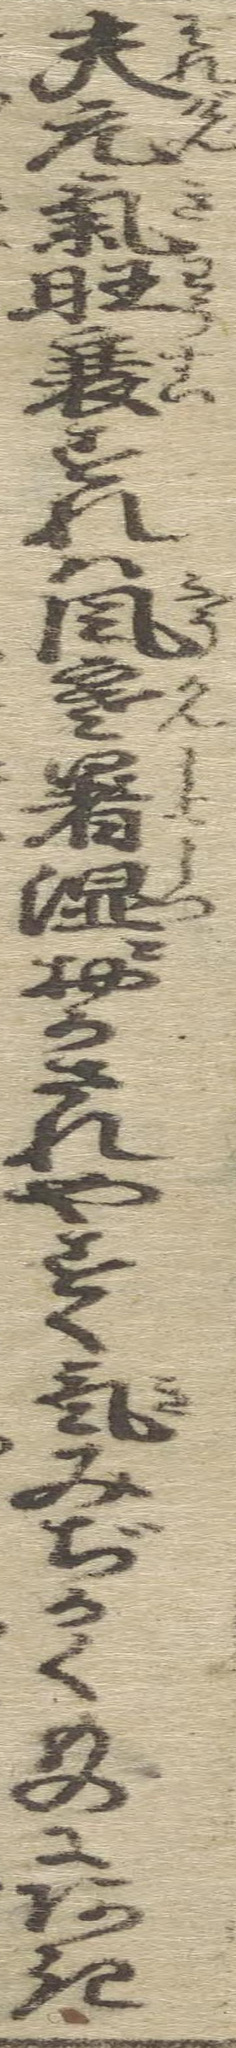夫元気旺衰すれは風寒暑濕におかされやすく気みぢかくものにあき
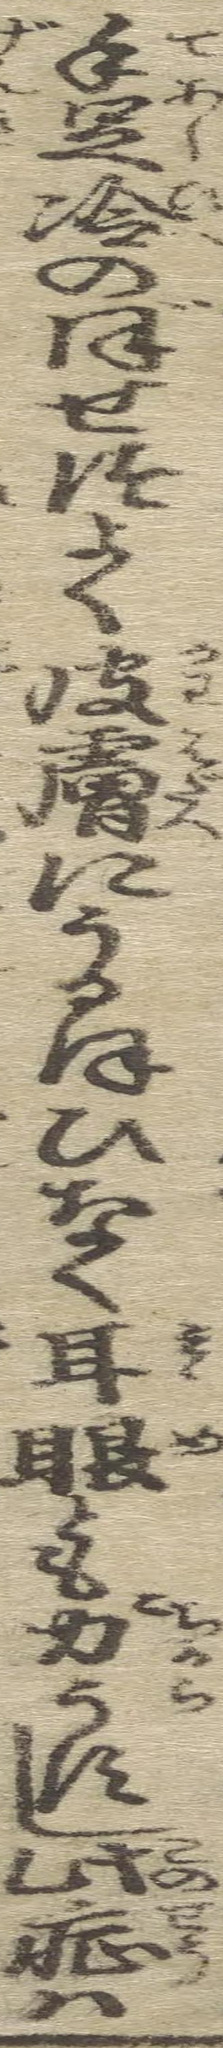手足冷のぼせつよく皮膚にうるほひなく耳眼とも力うすし此症は
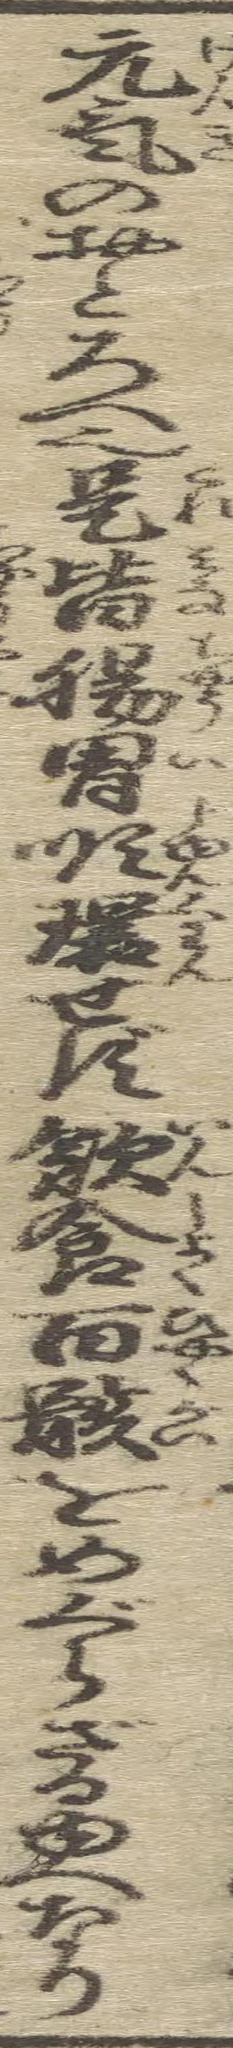元気のおとろへ也是皆腸胃順環せず飲食百骸をめぐらざるゆへなり
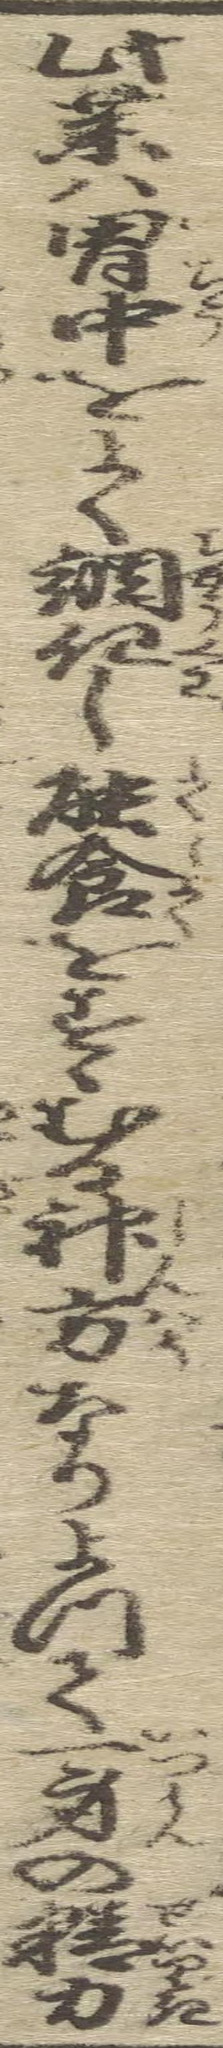此薬は胃中をよく調化し能食をすゝむる神方なりよつて一身の精力
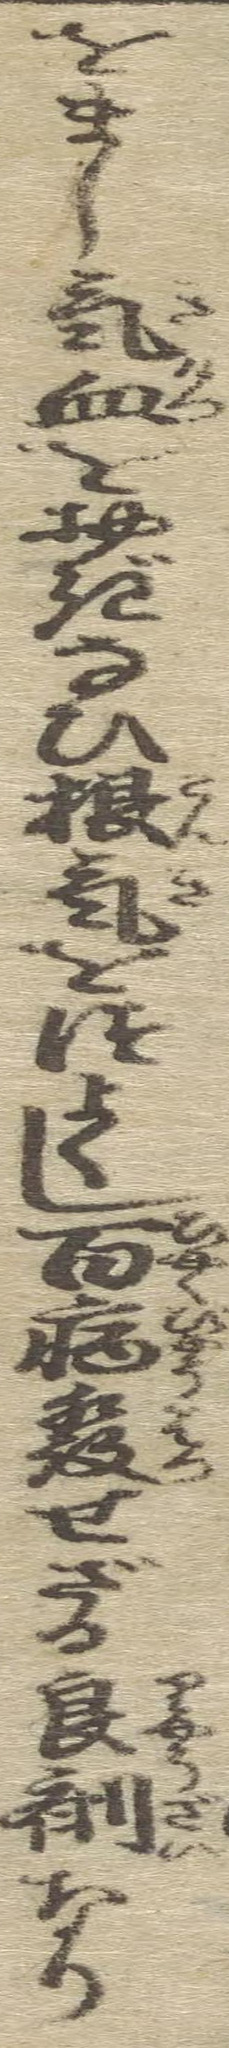をまし気血をおぎなひ根気をつよくし百病発せざる良劑なり
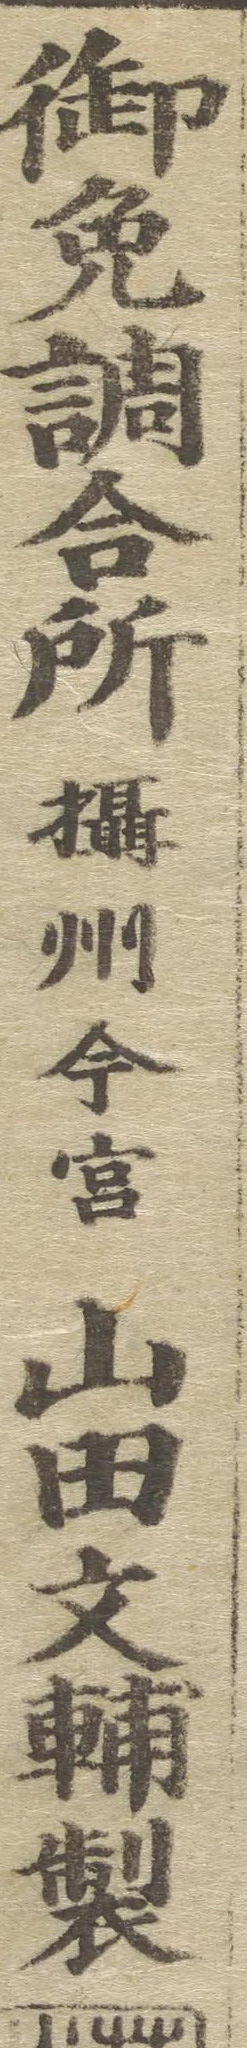御免調合所摂州今宮山田文輔製

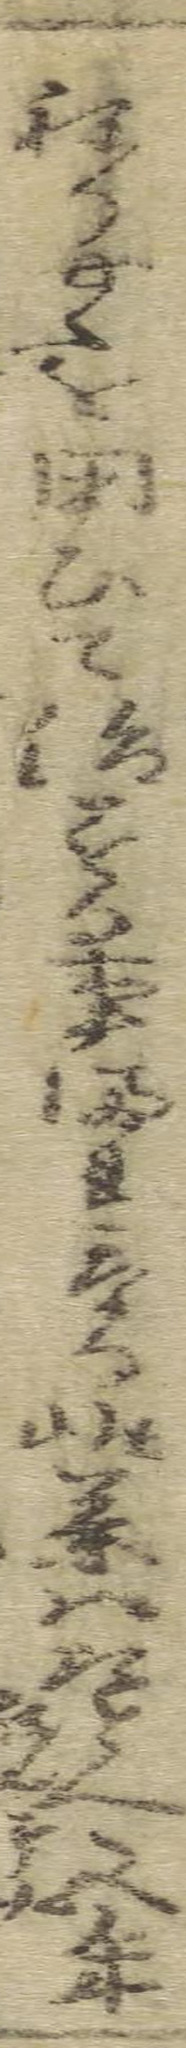ねりやくを用ひて治する事まれなる此薬はたとへ五年
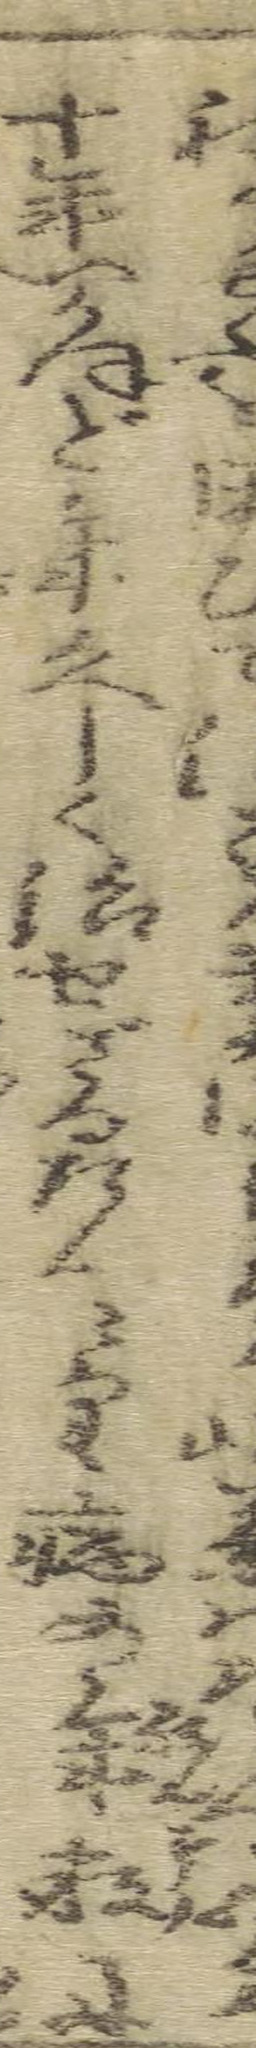十年いかほど年久しく治せざるたんニ而も病の年数に
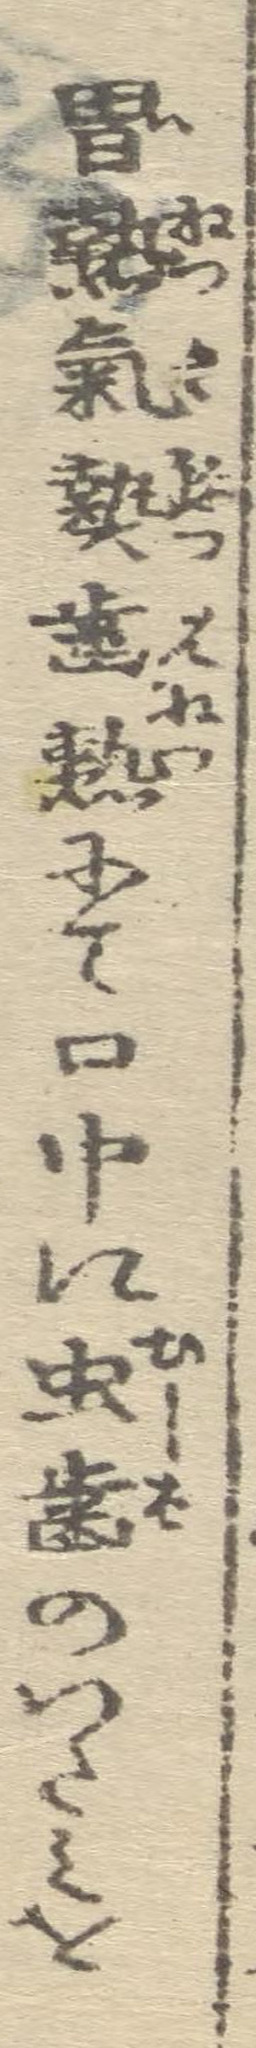胃熱気熱歯熱にて口中に虫歯のいたみを
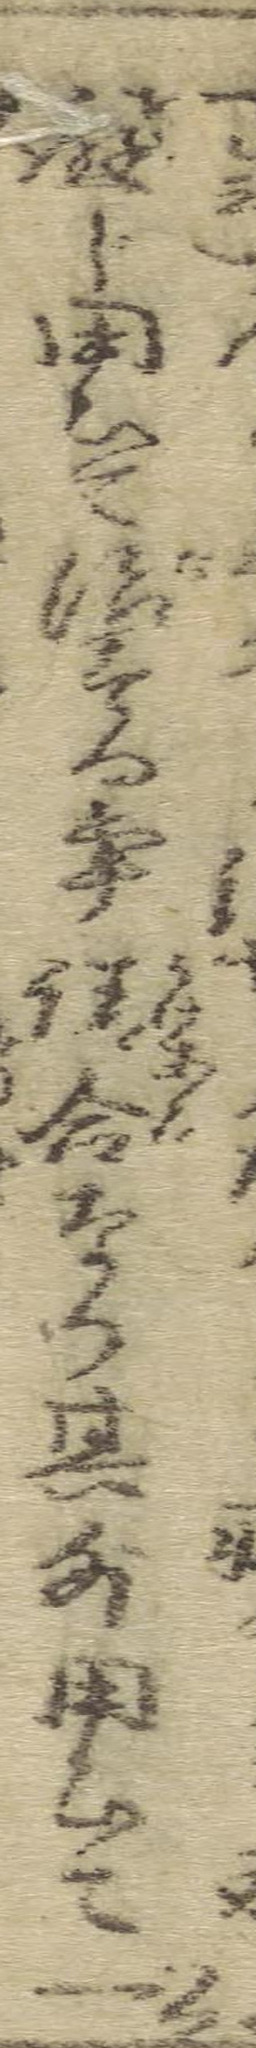応じ用ひて治する事請合なり其外用ひて一
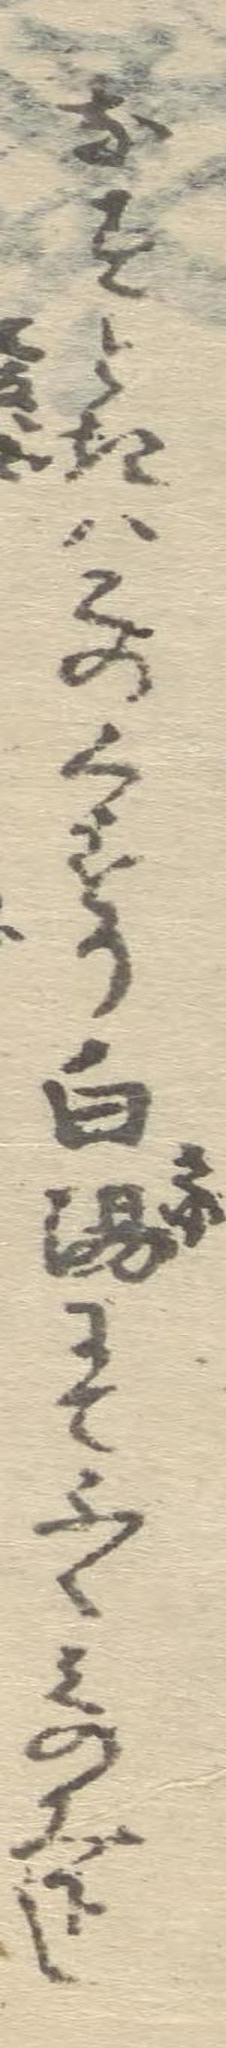なすときはこのくすり白湯にてふくみのみ下し
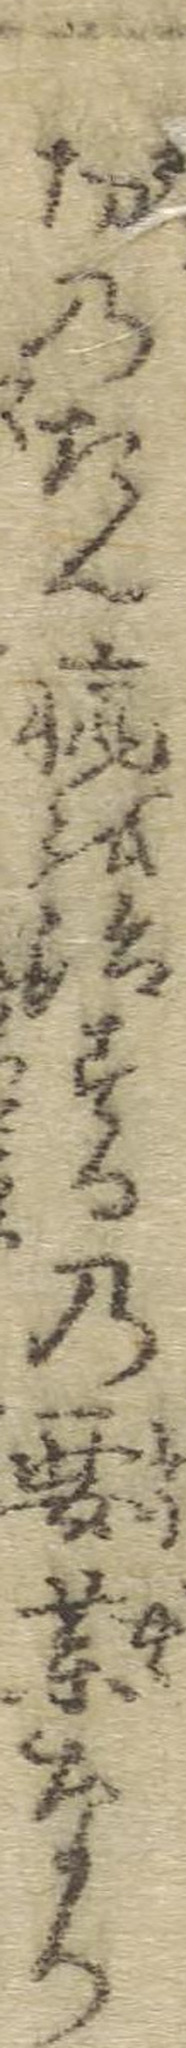切のたん病を治するの要薬なり
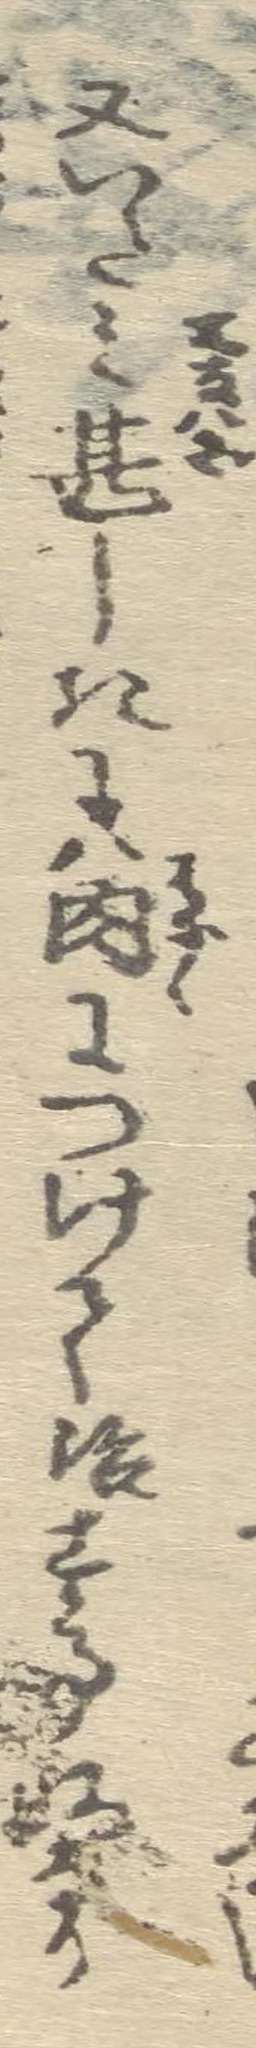又いたみ甚しきには肉につけて治す事妙なり
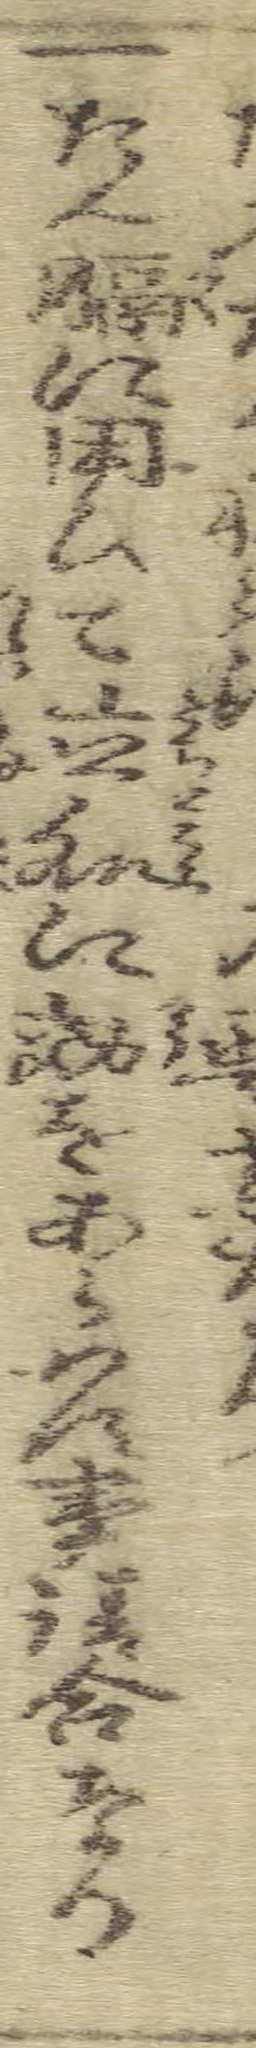一たん膈に用ひて立処に効をあらはす事請合なり
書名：浪華薬種問屋能書張交帖. 二
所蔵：国立国会図書館 National Diet Library, JAPAN
